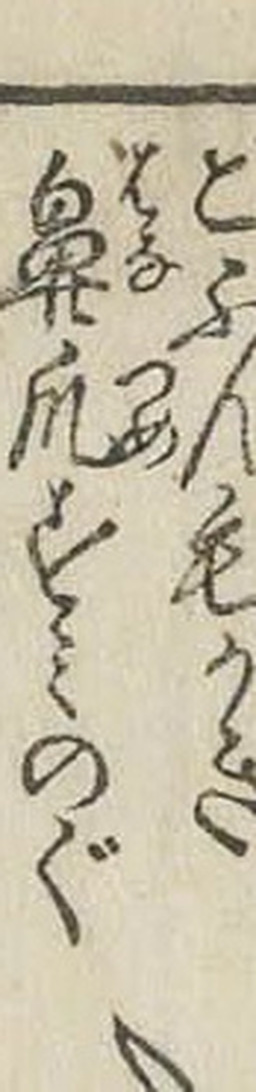鼻爪すみのぐ
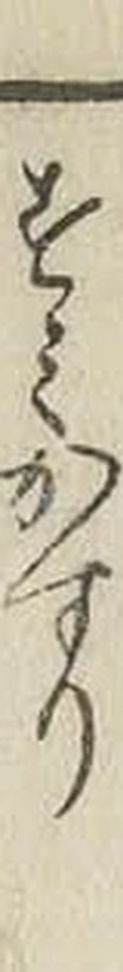すみかすり
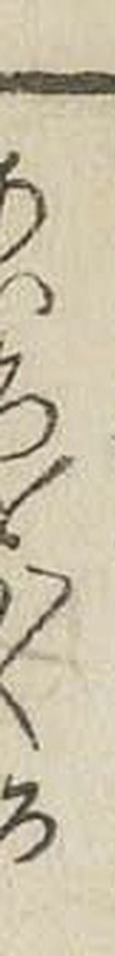あいろをかくる
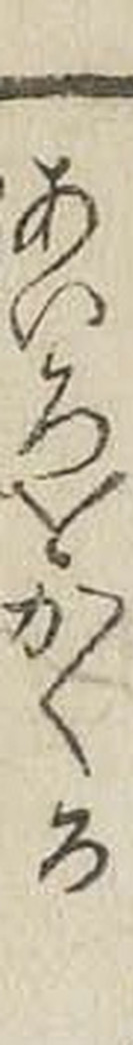あいろをかくる
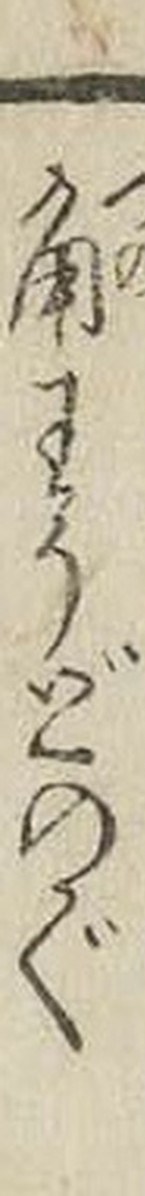角わうどのぐ
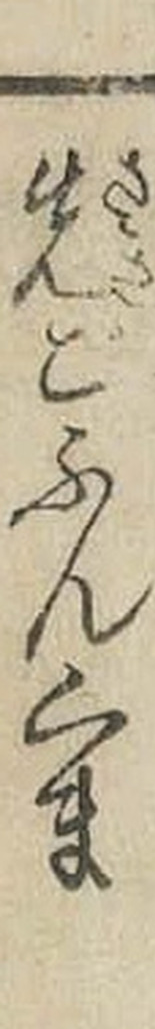先ごふんくま
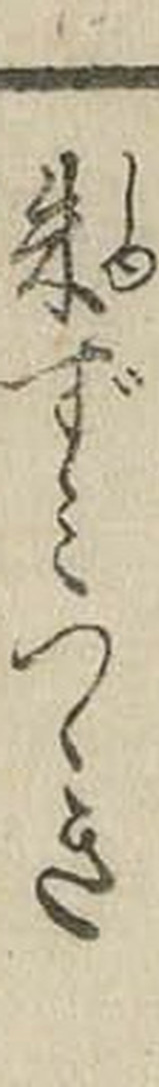朱ずみつゝき

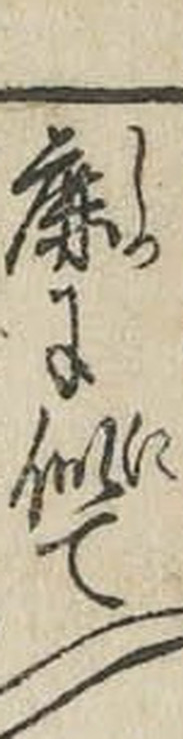鹿に似て
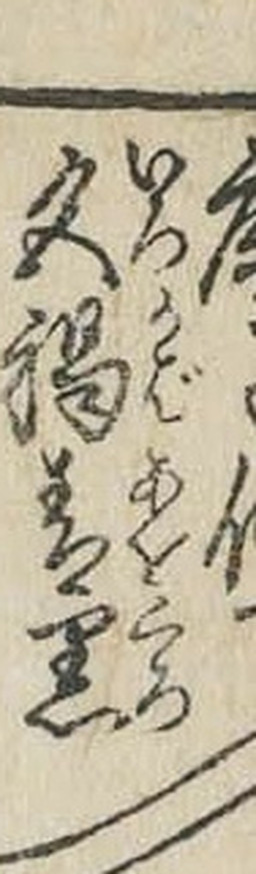色褐青黒
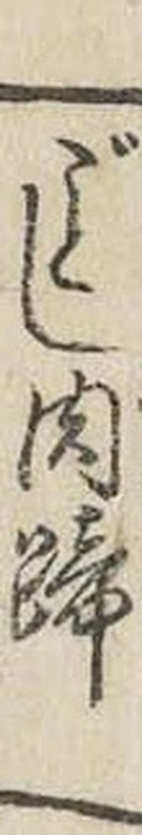ごとし肉蹄
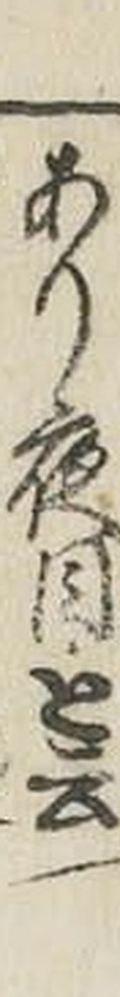あり夜目と云
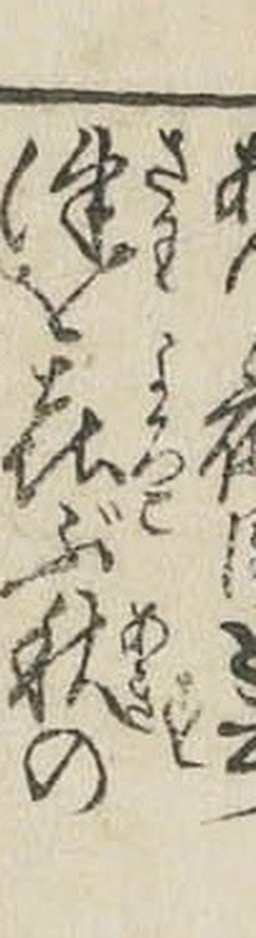沢を喜ぶ秋の
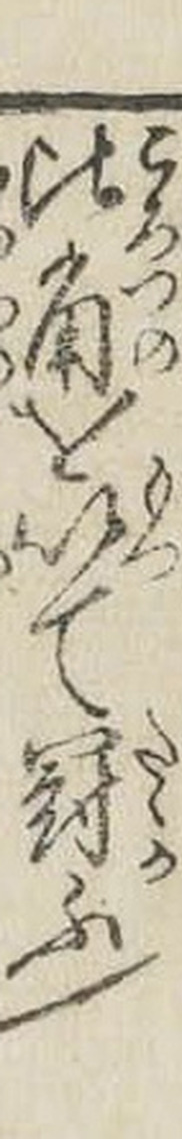比角を以て闘ふ
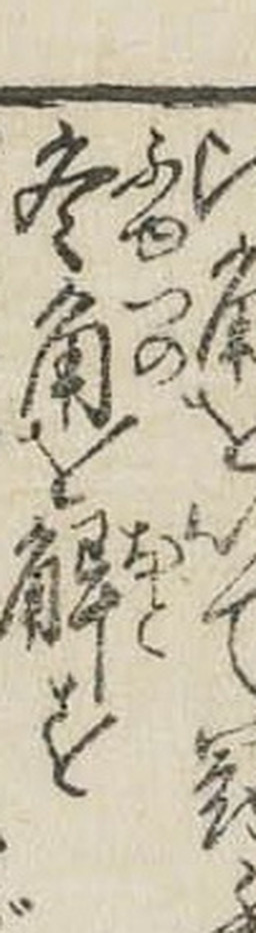冬角を解す
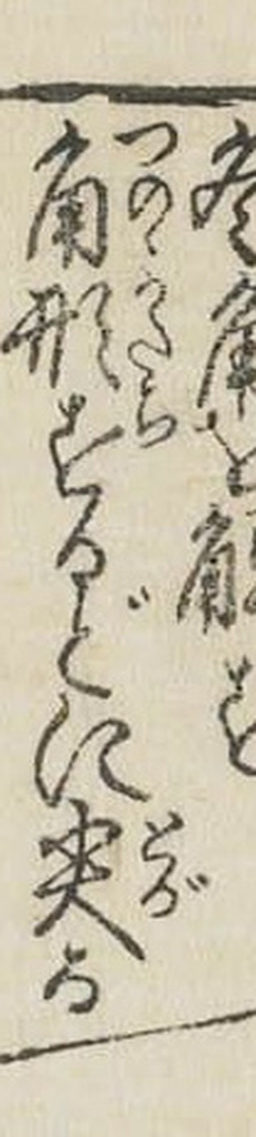角形するどに尖る
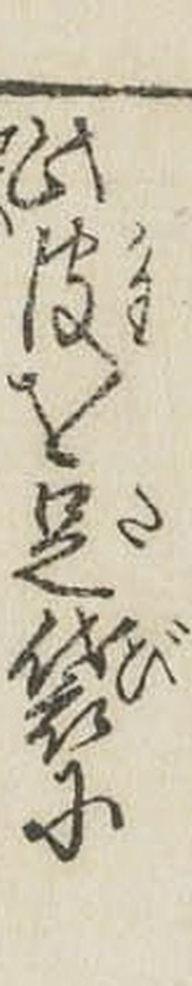此皮を足袋に
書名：絵本写宝袋 9巻 9之巻下
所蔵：東京学芸大学教育コンテンツアーカイブ
